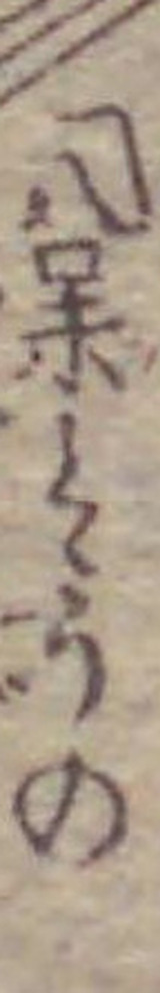〽八味うの
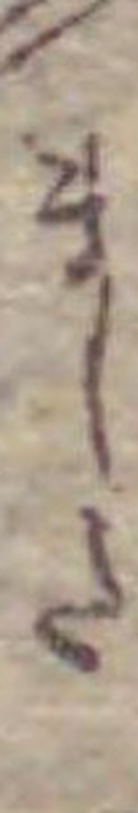ました
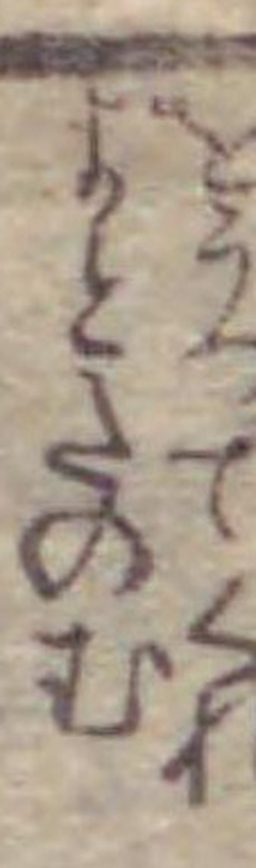よとたのむ

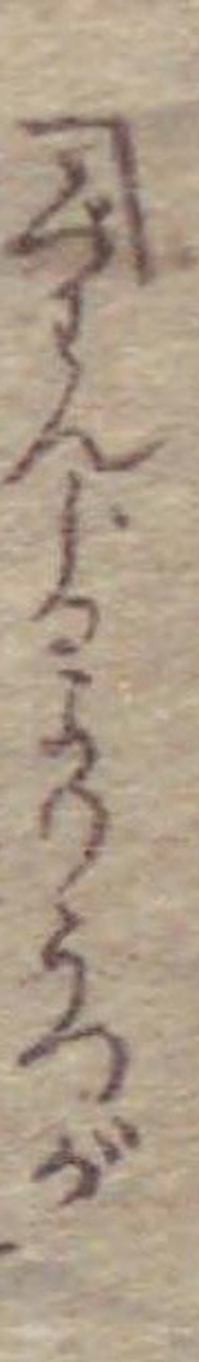〽ぐわんじるよりうつが
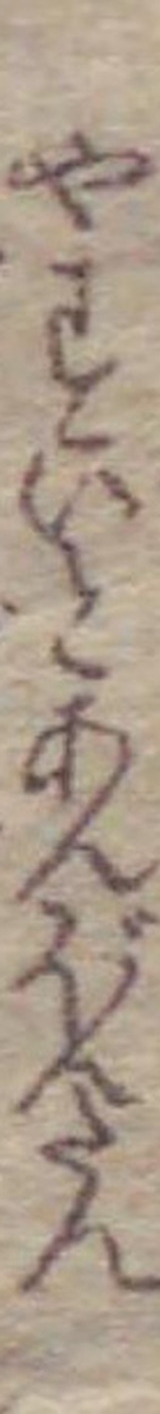やすいとあんぼんたん
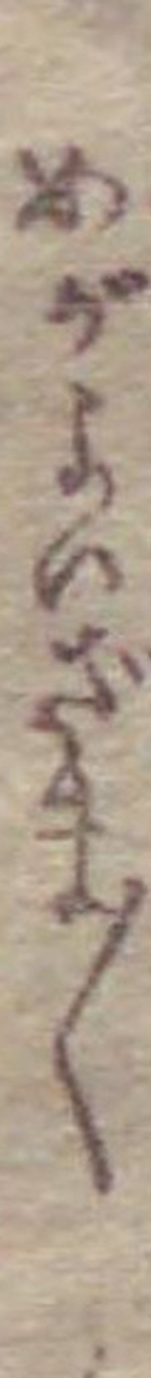めがよいざま〳〵
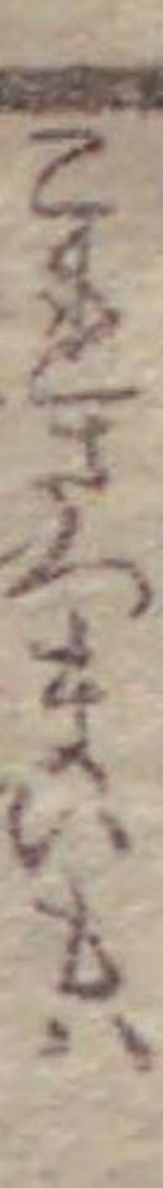これさつまいもは
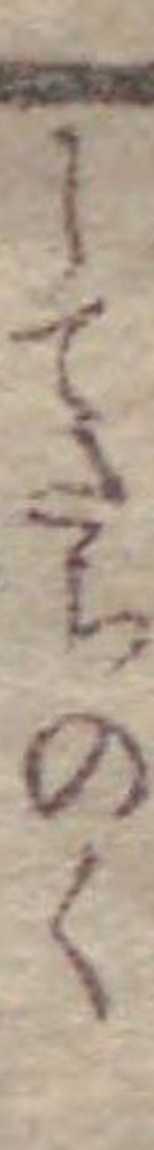してたちのく
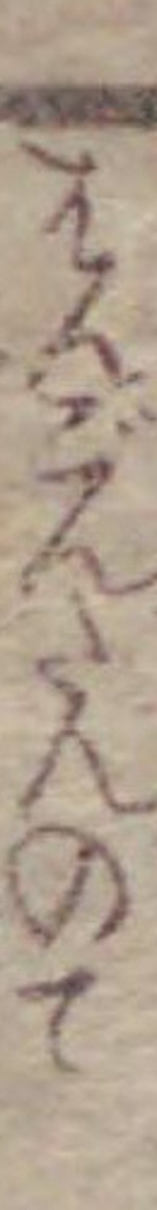はんごんたんのて
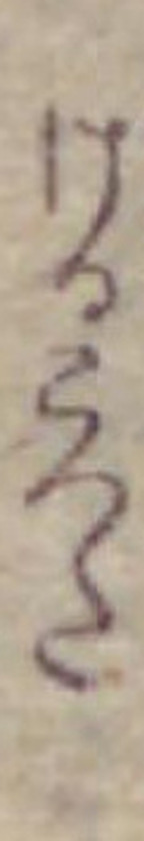げるこつた
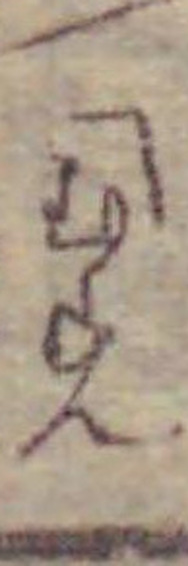〽むねん

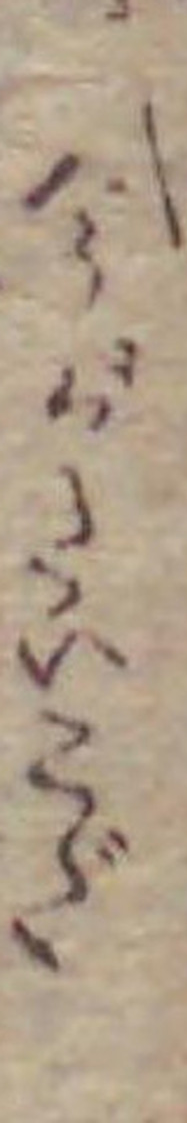〽今がたいこだ
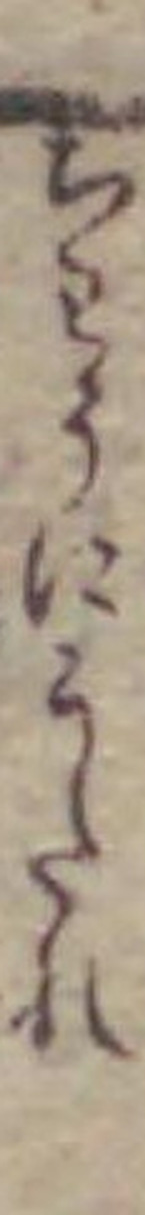ちわうにうたれ
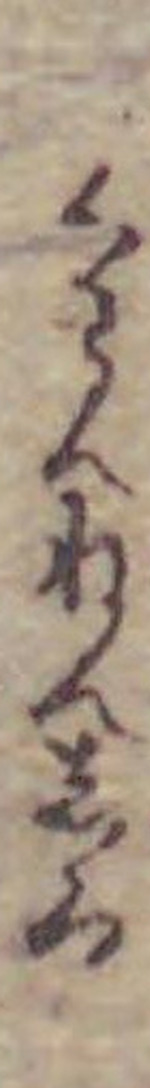くわんねんしろ
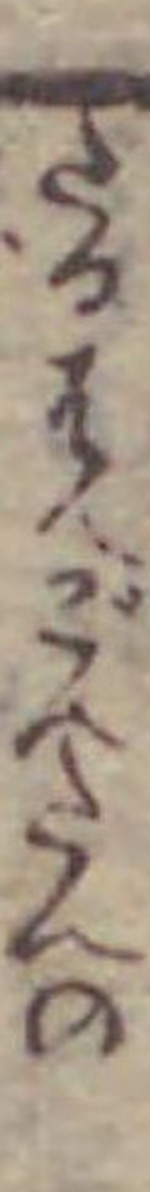たるはんごんたんの
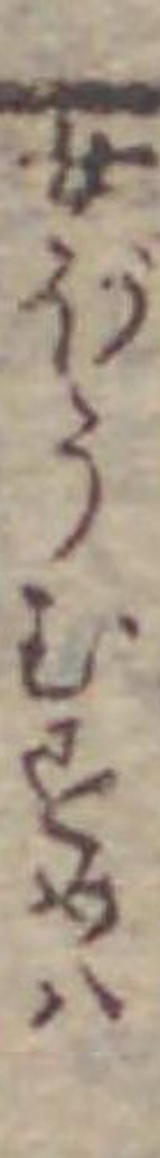女ぼうむすめは
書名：鼻下長生薬 : 3巻
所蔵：国立国会図書館 National Diet Library, JAPAN
